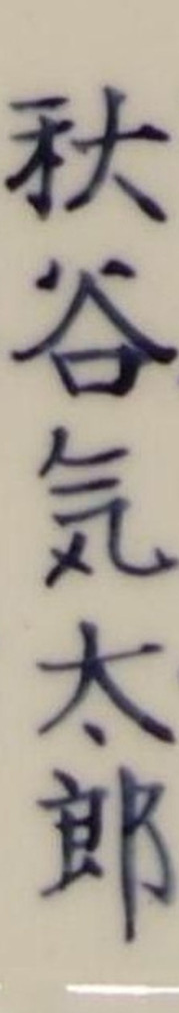秋谷気太郎
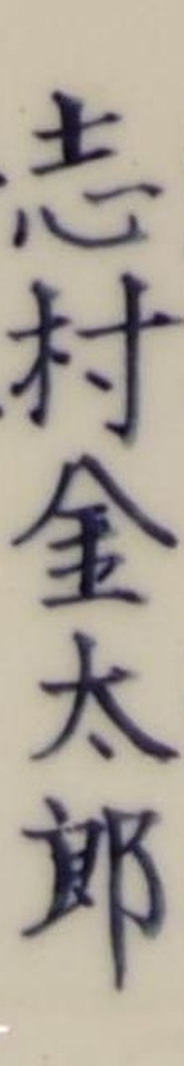志村金太郎
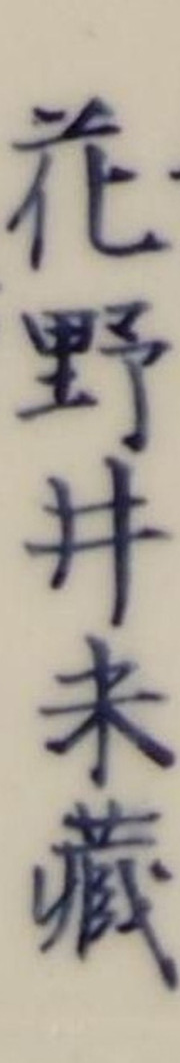花野井未蔵

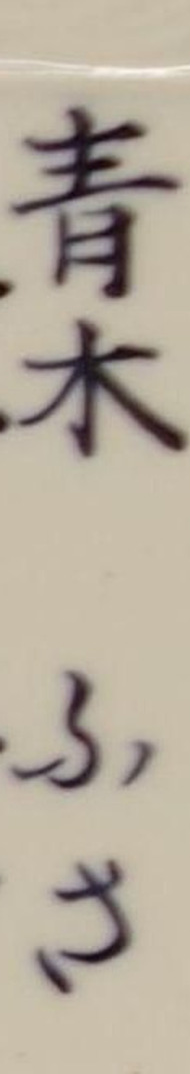青木ふさ
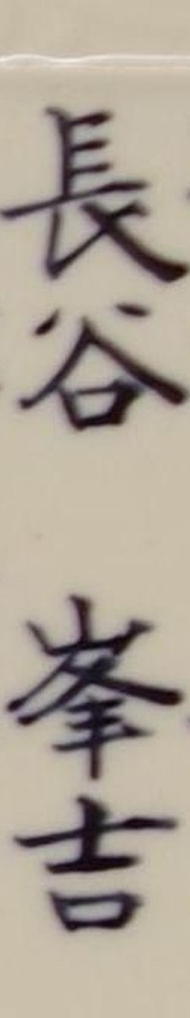長谷峯吉
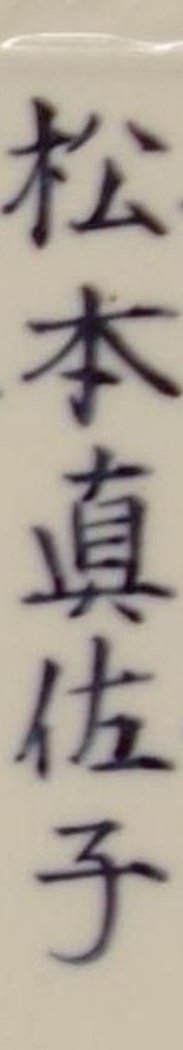松本真佐子
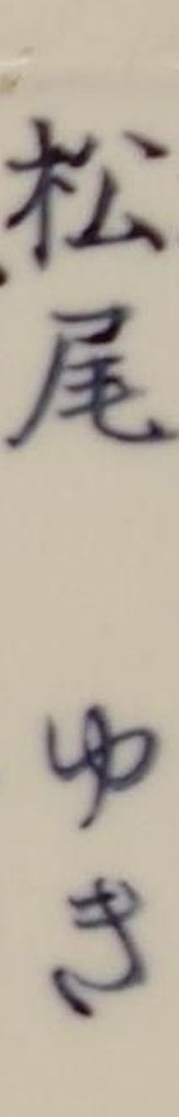松尾ゆき
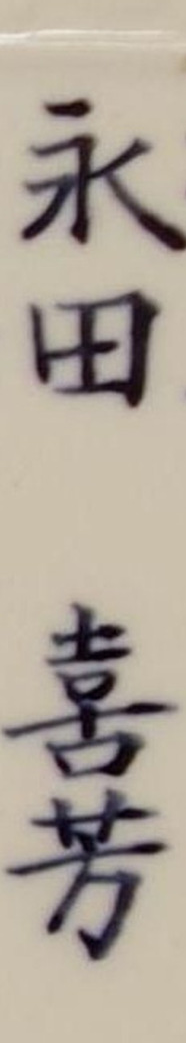永田喜芳
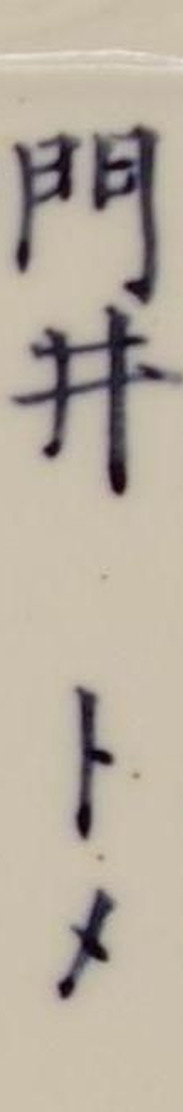門井トメ
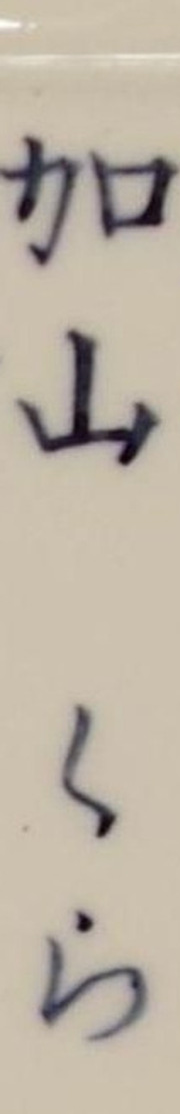加山くら
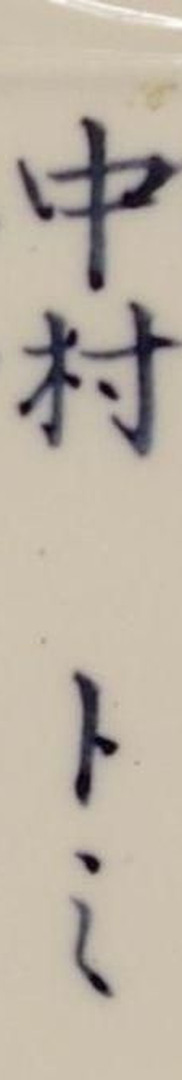中村トミ
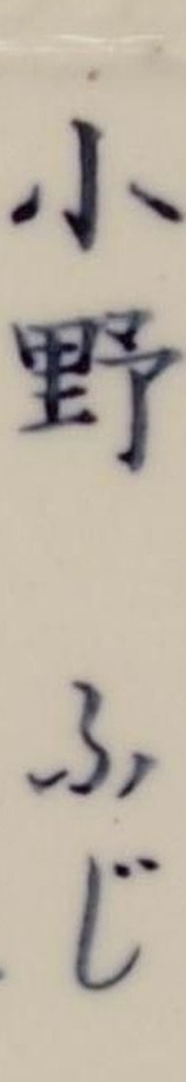小野ふじ
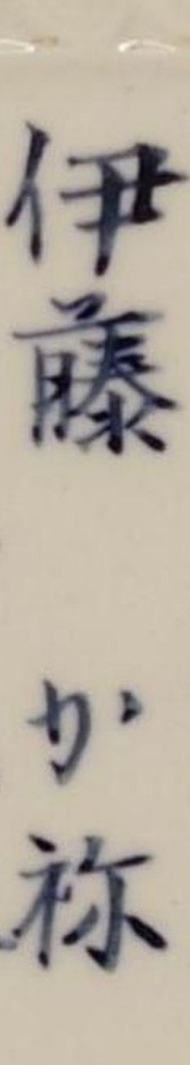伊藤かね
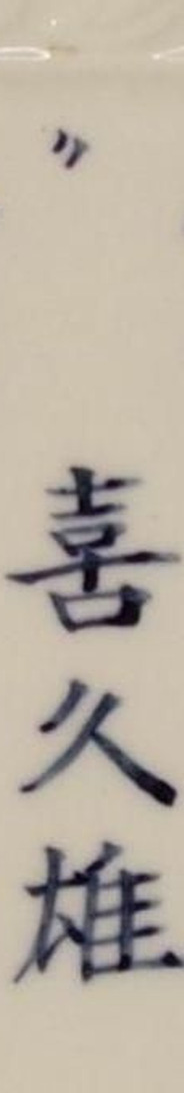喜久雄
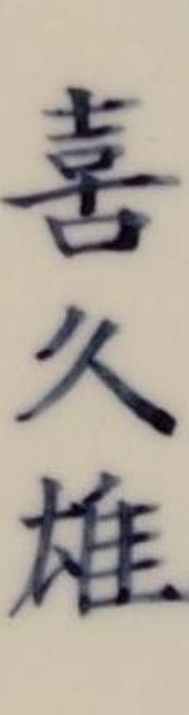喜久雄
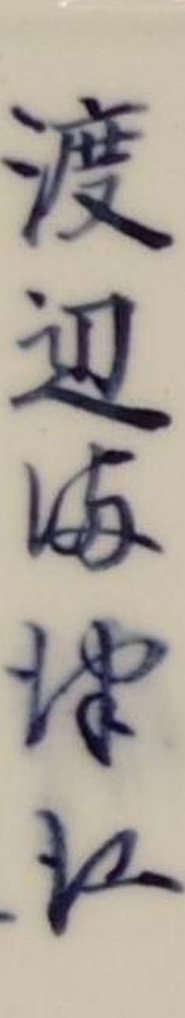渡辺まつ江
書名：M~S
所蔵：高野山金剛峯寺
